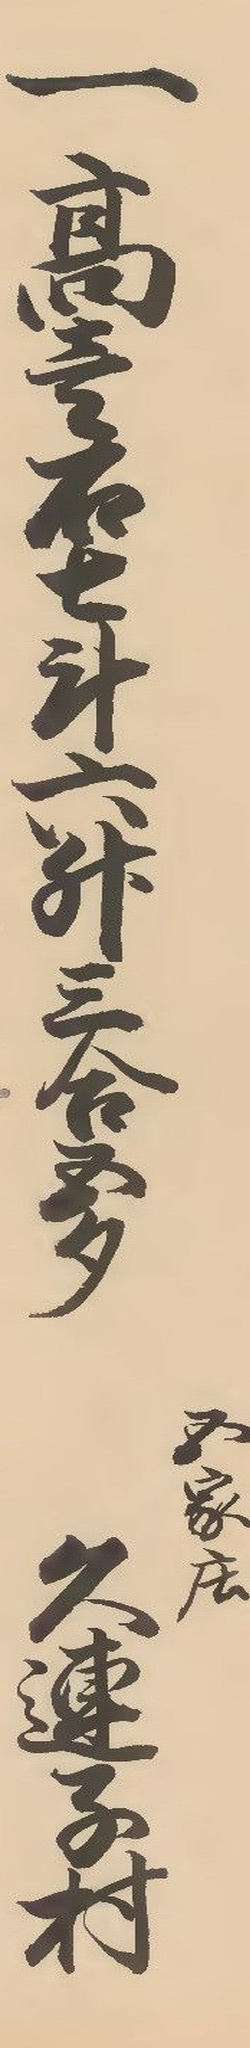一髙壱石七斗六升三合五夕久連子村

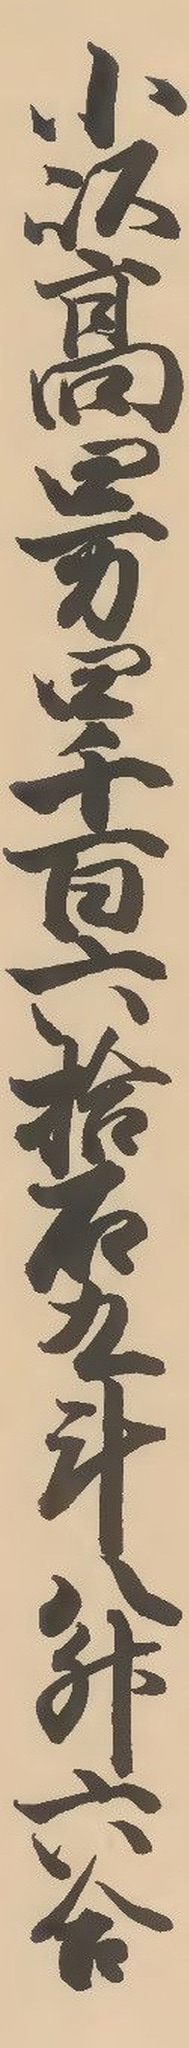小以髙四万四千百六拾石九斗八升六合

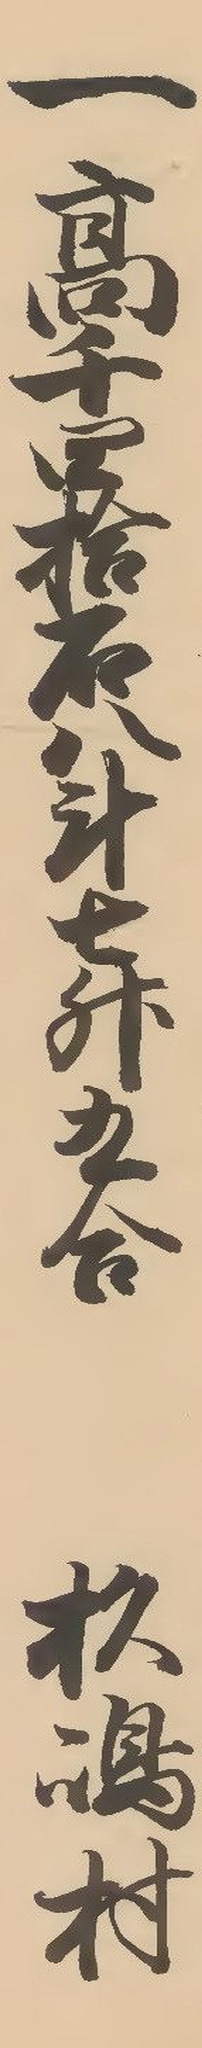一髙千四拾石八斗七升九合杦嶋村
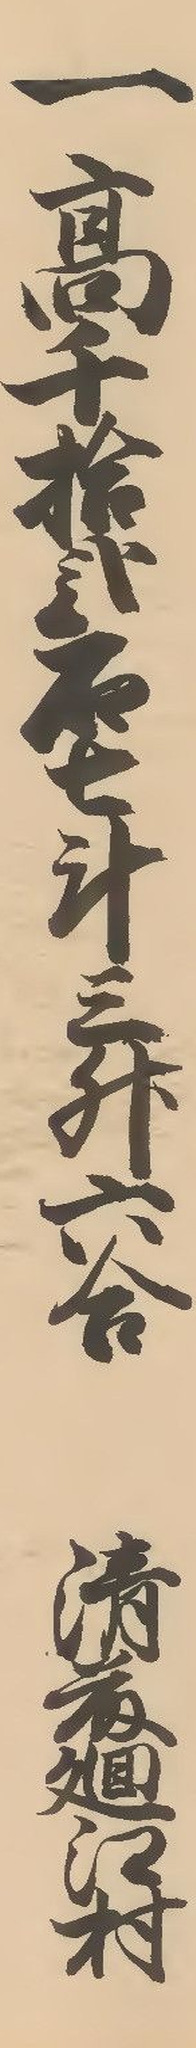一髙千拾弐石七斗三升六合清藤廻江村
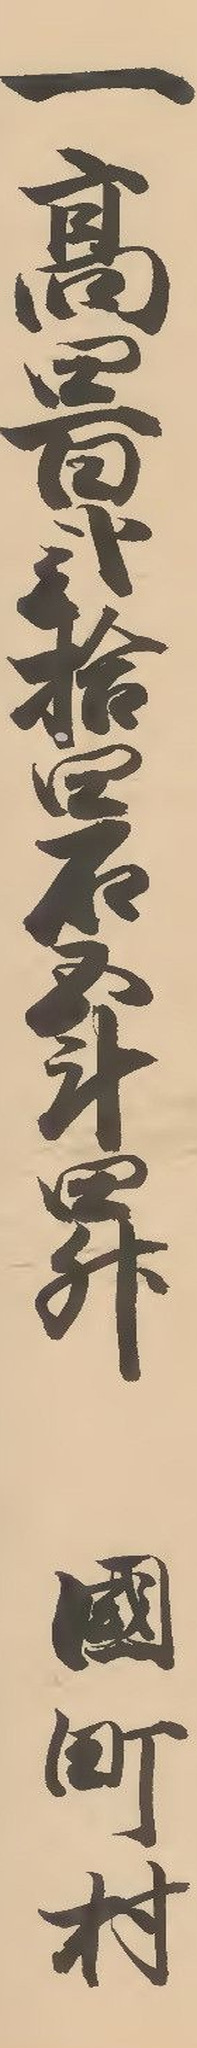一髙四百弐拾四石五斗四升國町村
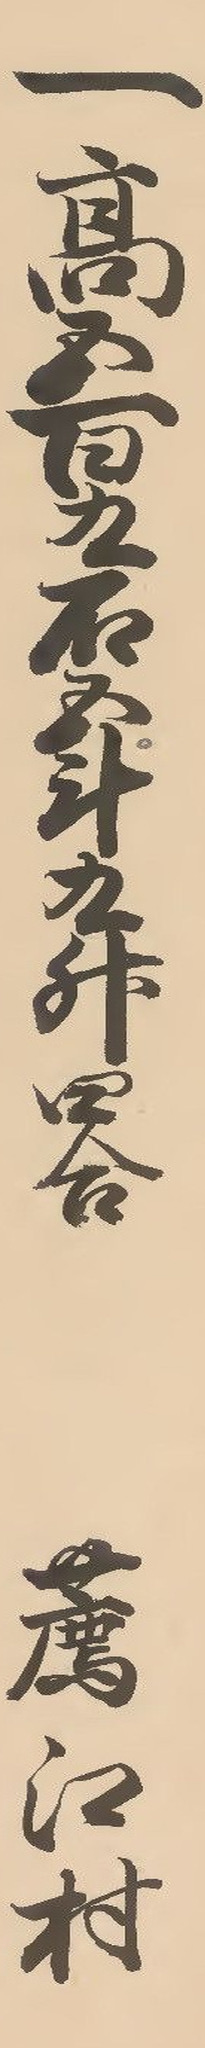一髙五百九石五斗九升四合薦江村
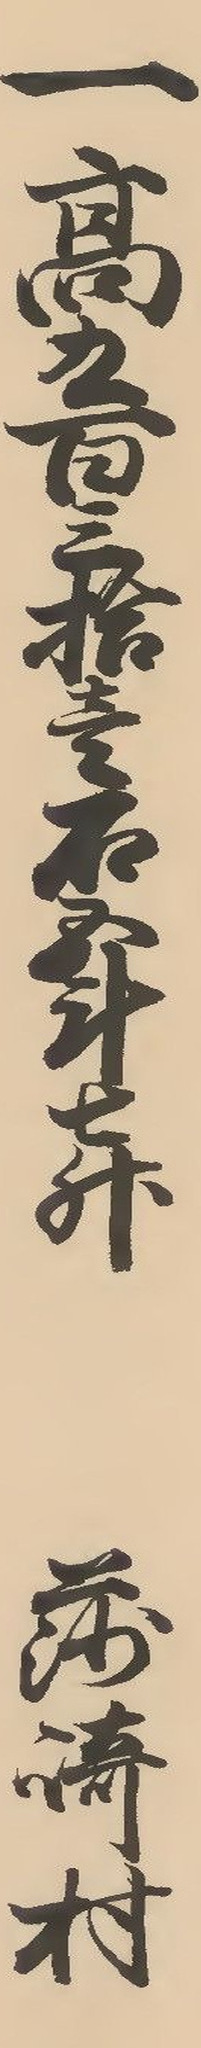一髙九百三壱石五斗七升莎崎村
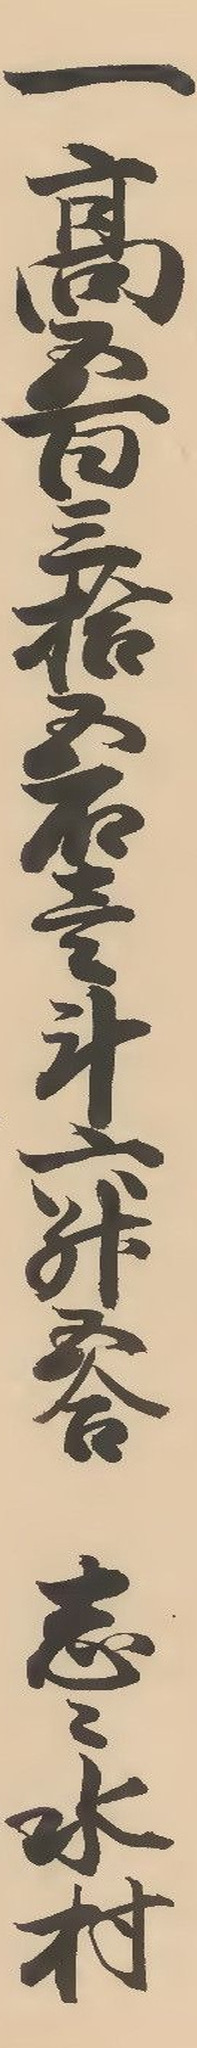一髙五百三拾五石壱斗六升五合志々水村
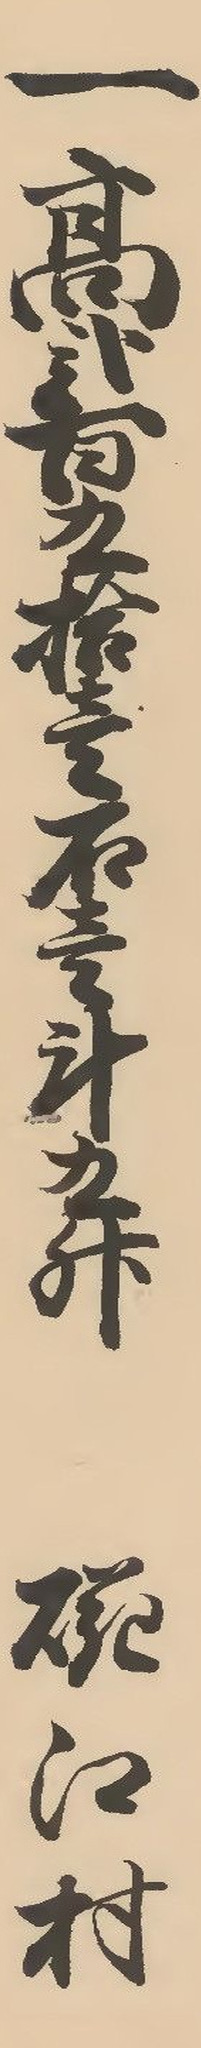一髙弐百九拾壱石壱斗九升江村

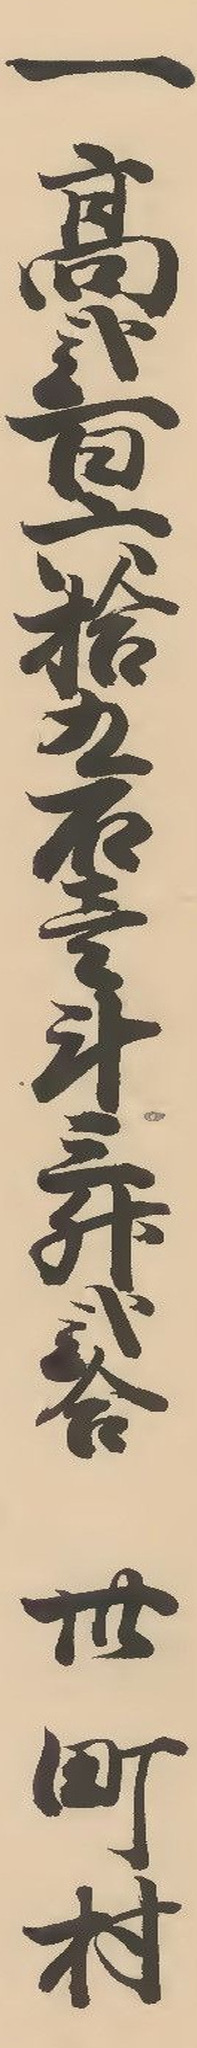一髙弐百六拾九石壱斗三升弐合卅町村
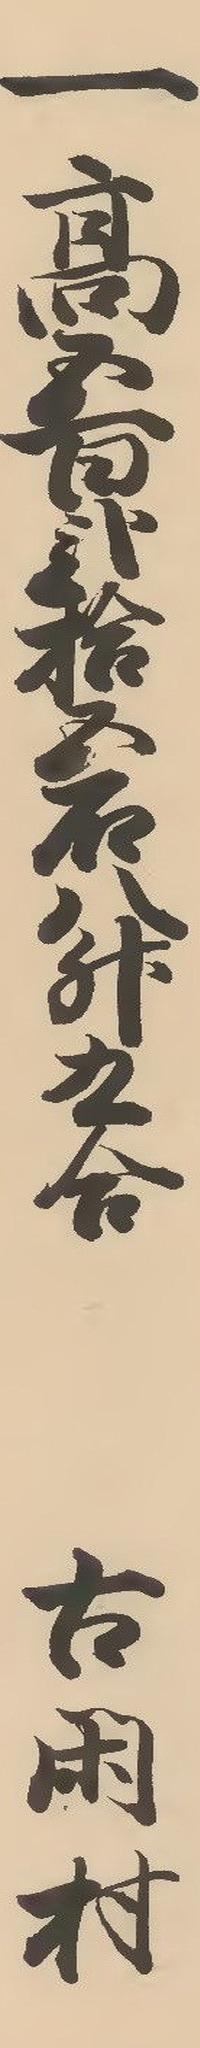一髙五百弐拾五石八升九合古閑村
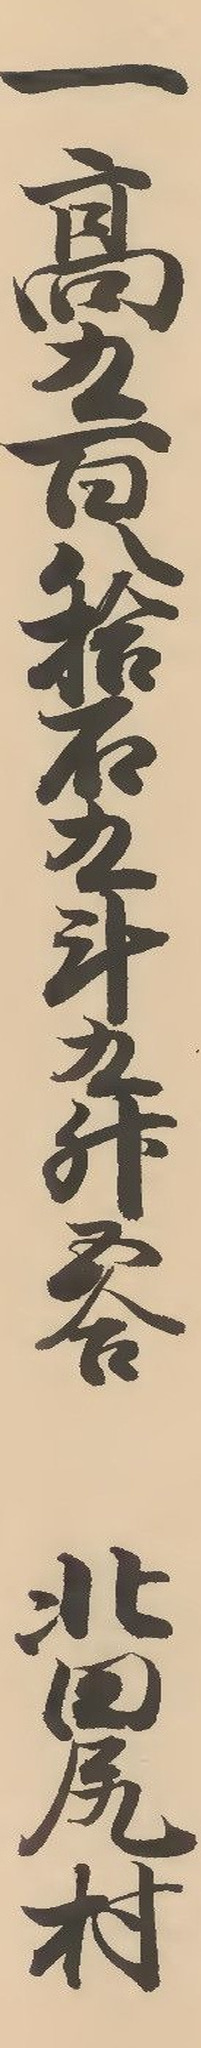一髙九百八拾石九斗九升五合北田尻村
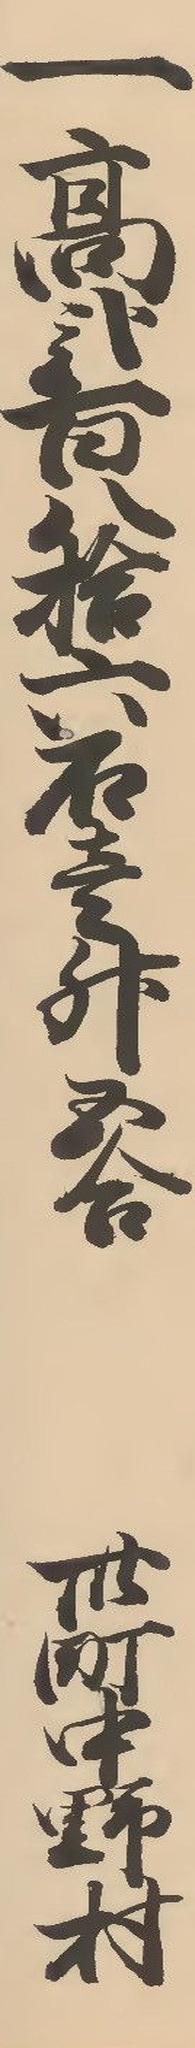一髙弐百八拾六石壱斗五升卅町中野村
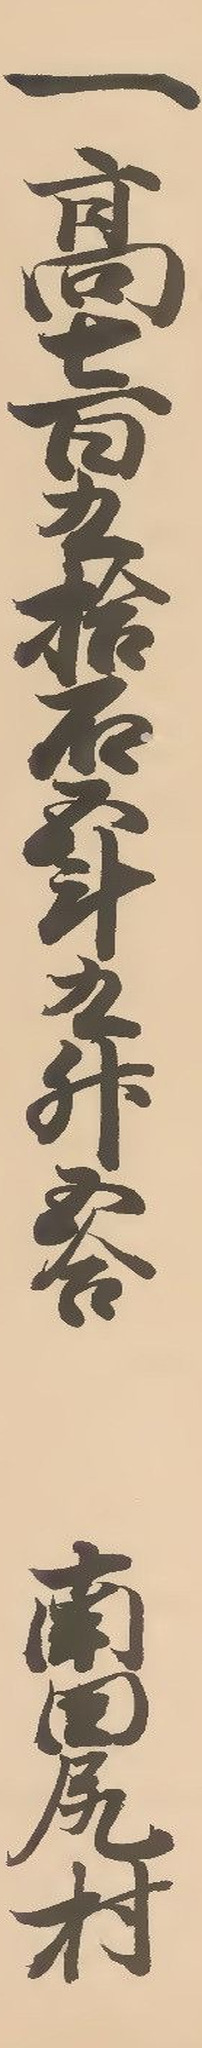一髙七百九拾石五斗九升五合南田尻村
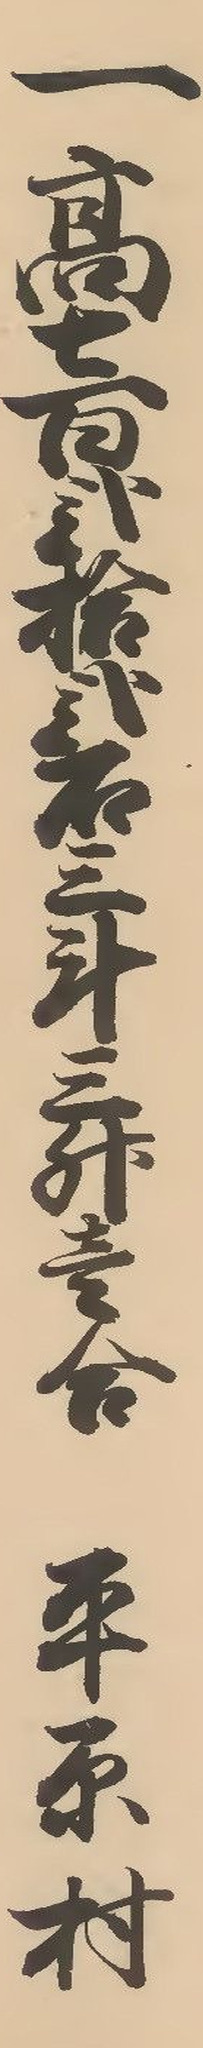一髙七百弐拾弐石三斗三升壱合平原村
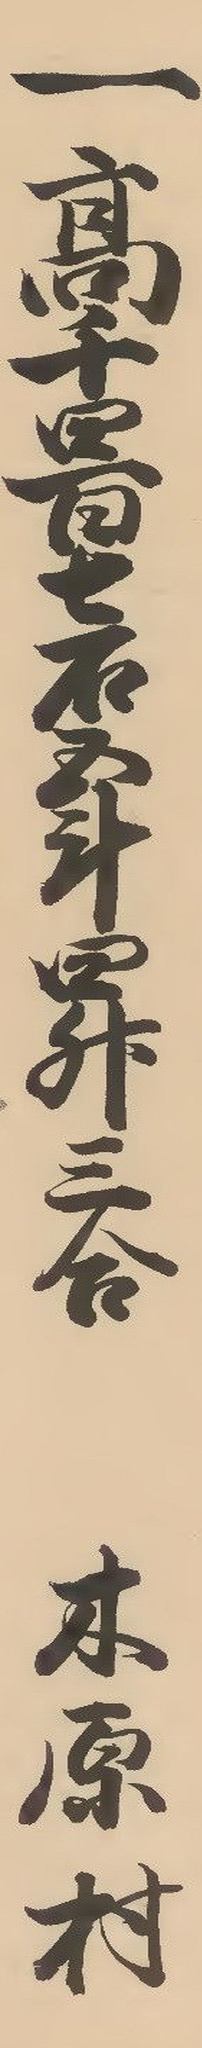一髙千四百七石五斗四升三合木原村
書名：肥後国郷帳
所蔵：国立公文書館 National Archives of Japan
